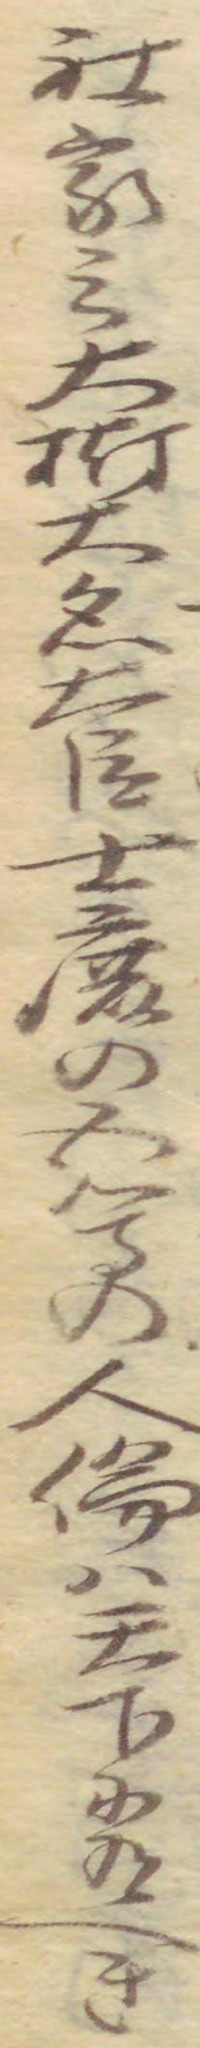社家云大樹大名大臣士庶の五等の人倫は天下に有へき

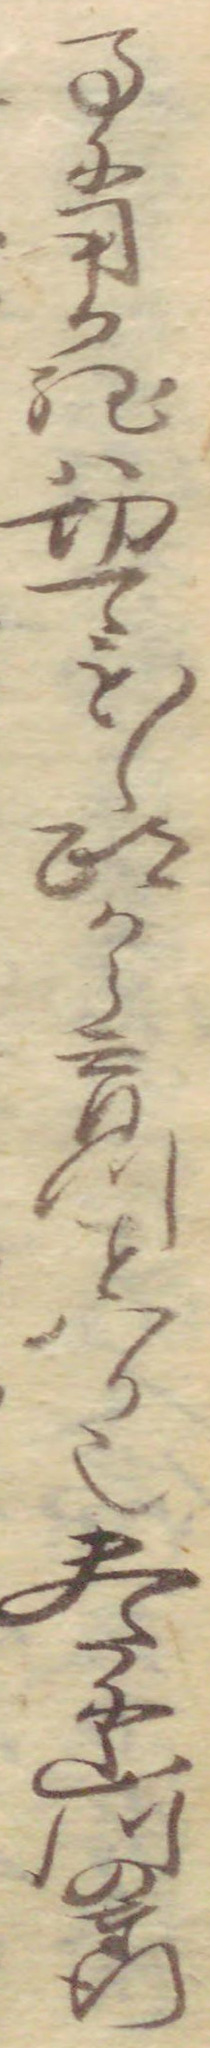事に用る程は切ても〳〵跡から育つことはり也夫たに山川の奉行
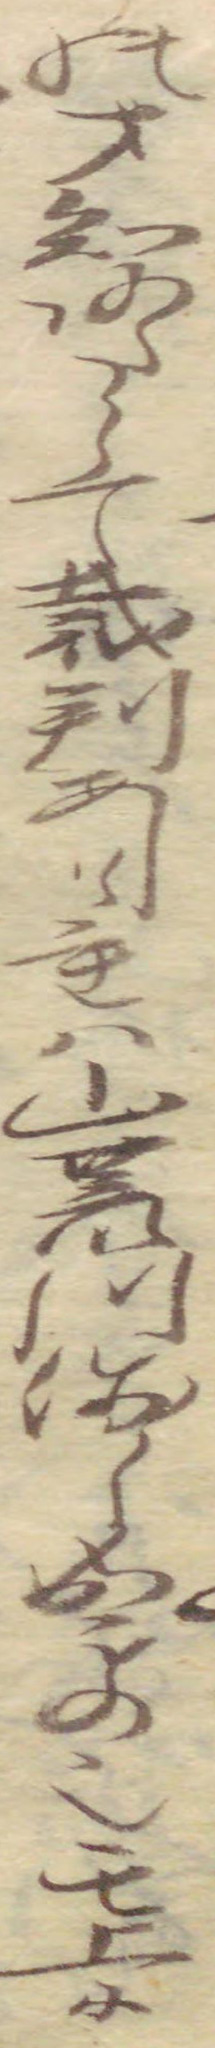の才知あたらて裁判あしけれは山荒川浅く成もの也其上に
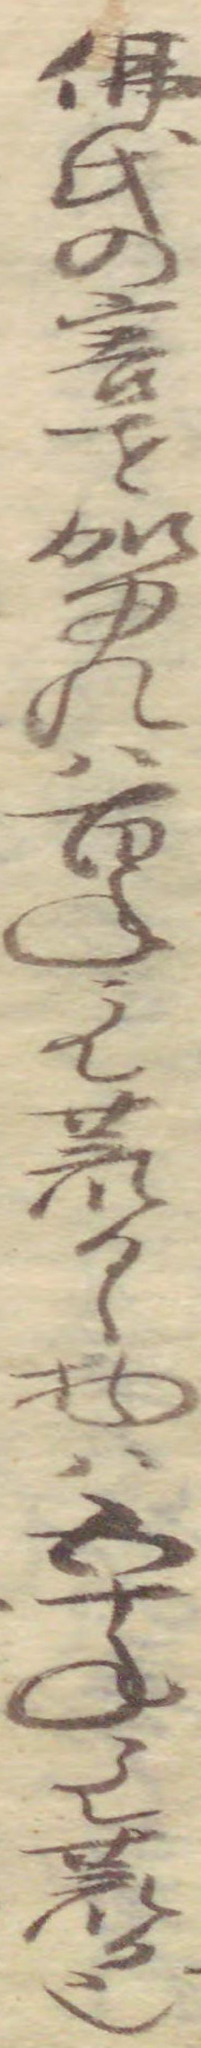仏氏の害を加ゆれは百年ニて荒るゝ物は五十年ニて荒る也
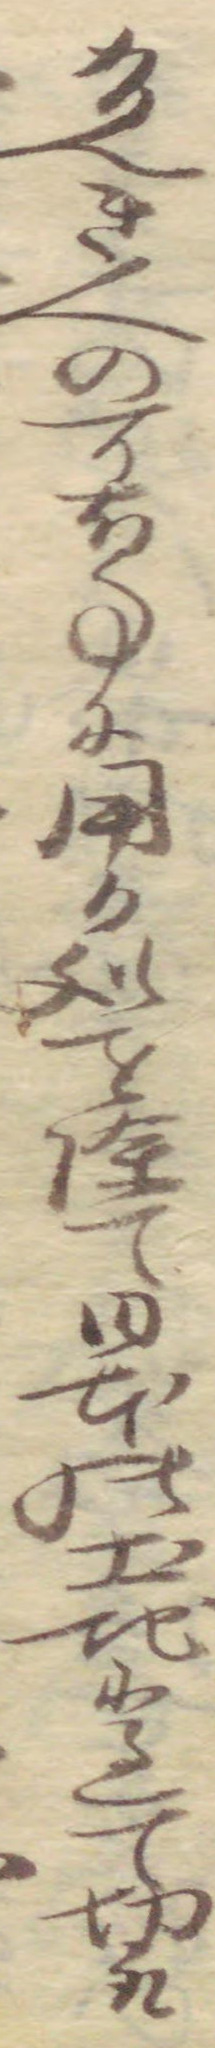有へき人の可有事に用る処を除て日本の土地に過て切取
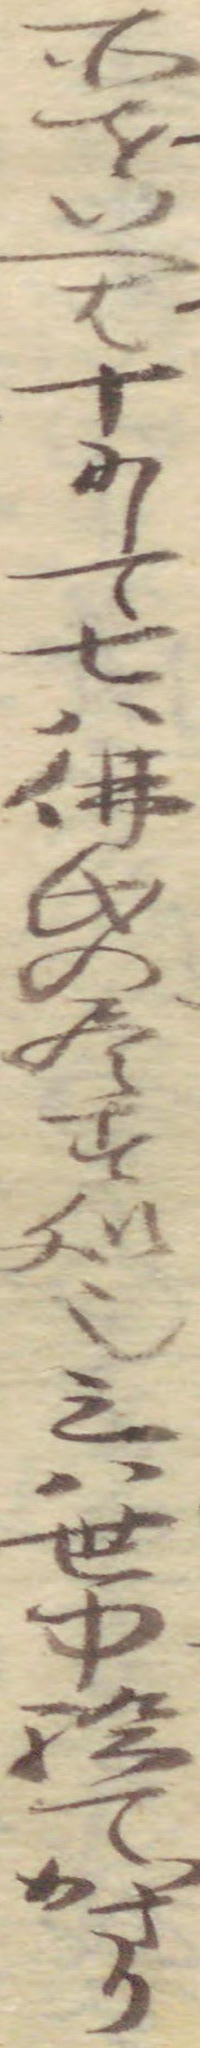所をいへは十にして七は仏氏の尽す処也之は世中驕てかさり
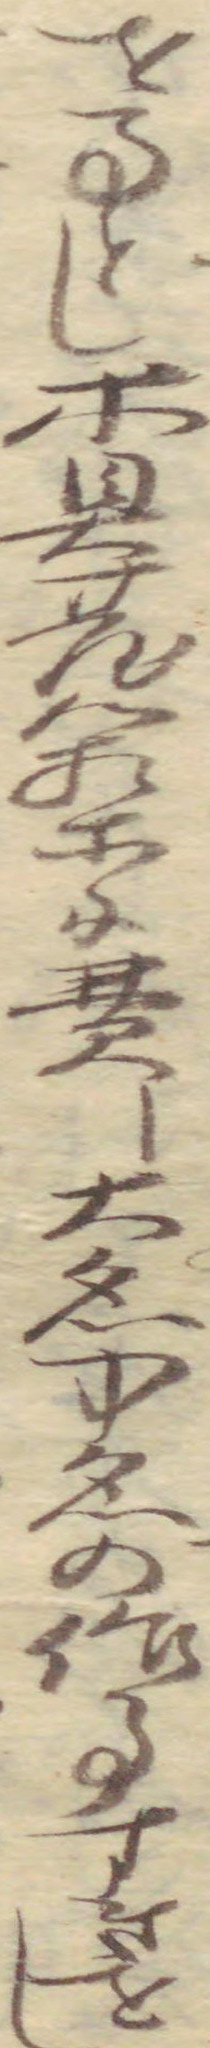を事とし木具台箱等に費し大名中名の作事すきをし
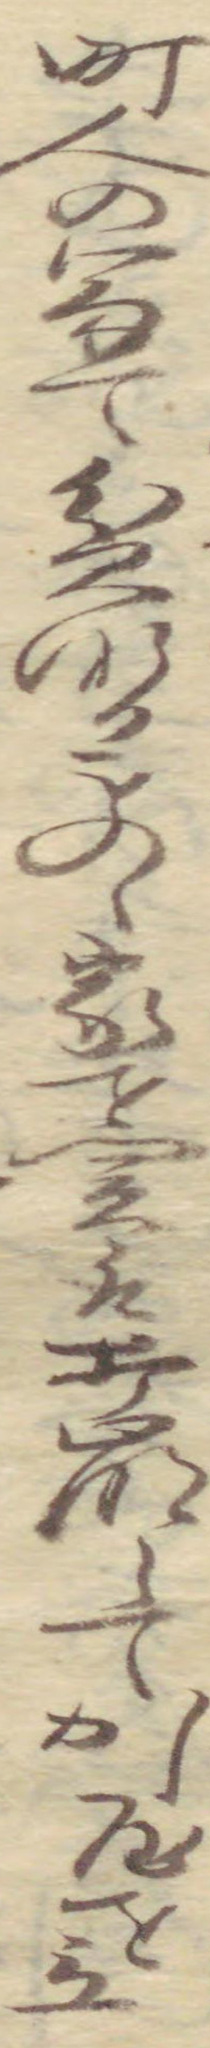町人の富て貧なるものゝ家を買取打崩してかし屋を立
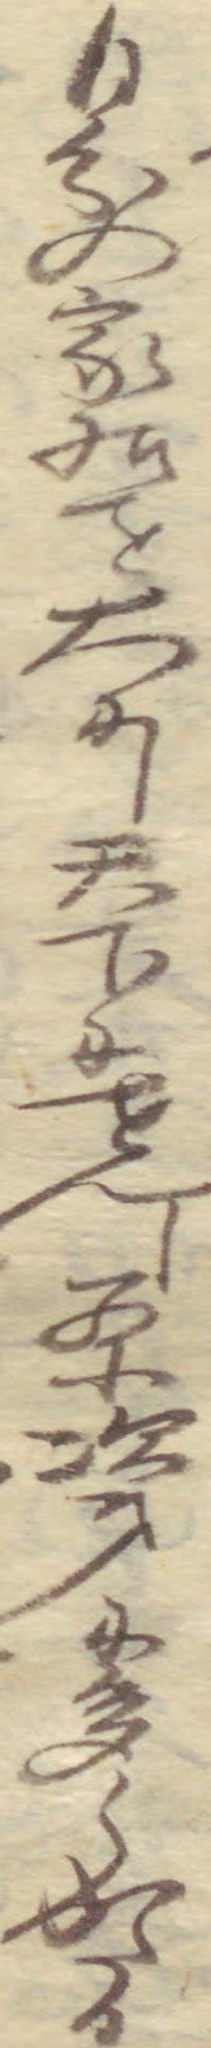自分の家居を大にし天下にせんし茶次第に多く成たる
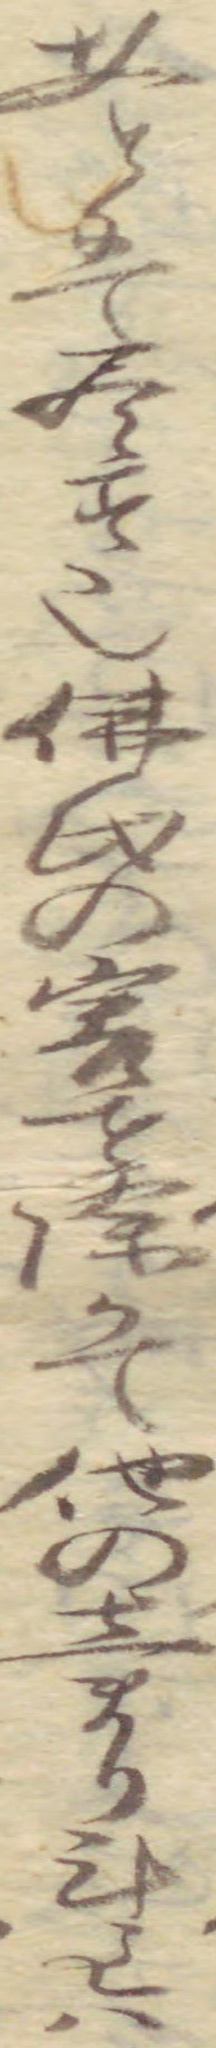なとにて尽す也仏氏の害を除かて他のしまり計ニては
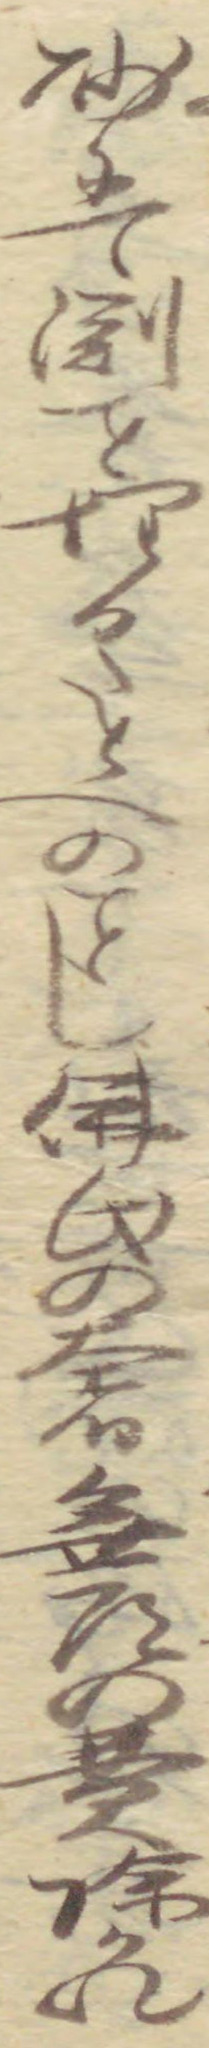砂にて渕を埋るたとへのことし仏氏の奢無道の費除かれ
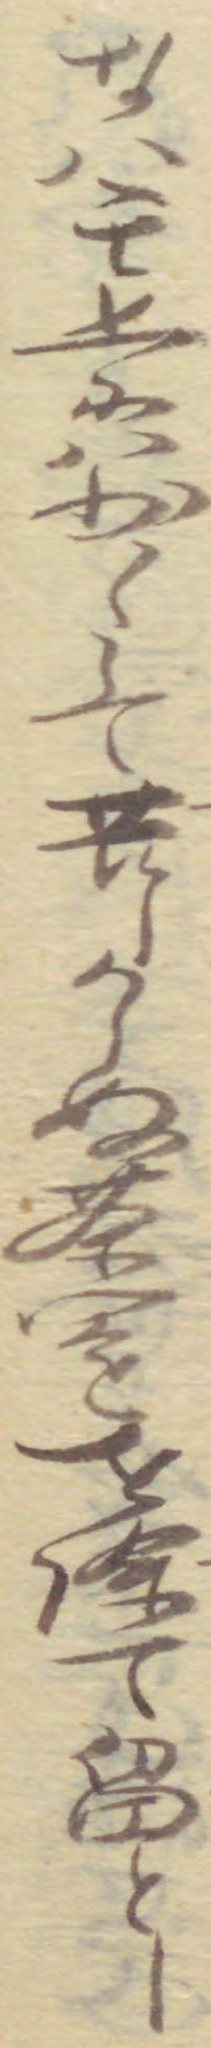なは其上には少くして苦しからぬ茶園を除て畠とし
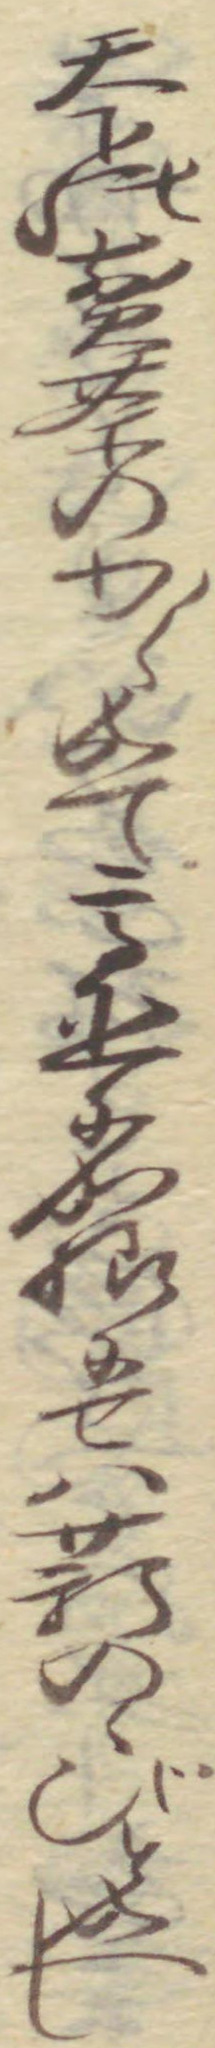天下の煎茶の少く成て高直に成様にせは薪のゝびと成へし
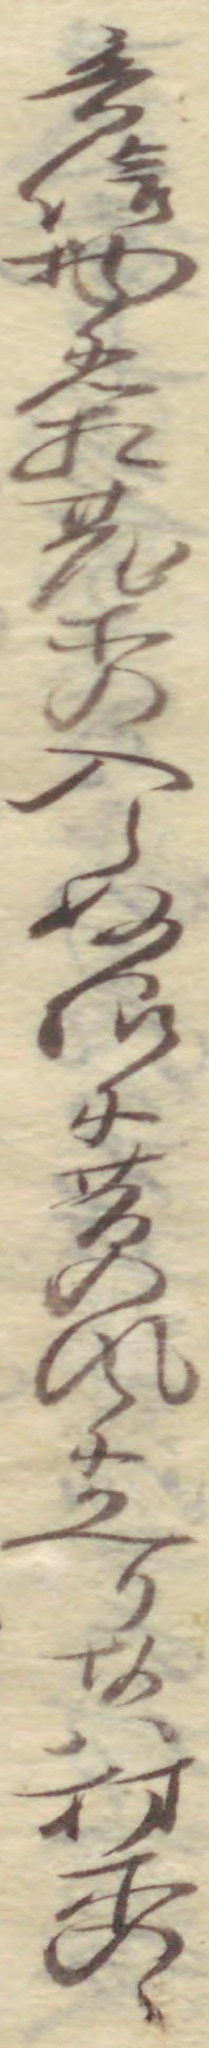音信物に箱台等の入らぬ様に昔の風にかへりなは材木のゝ
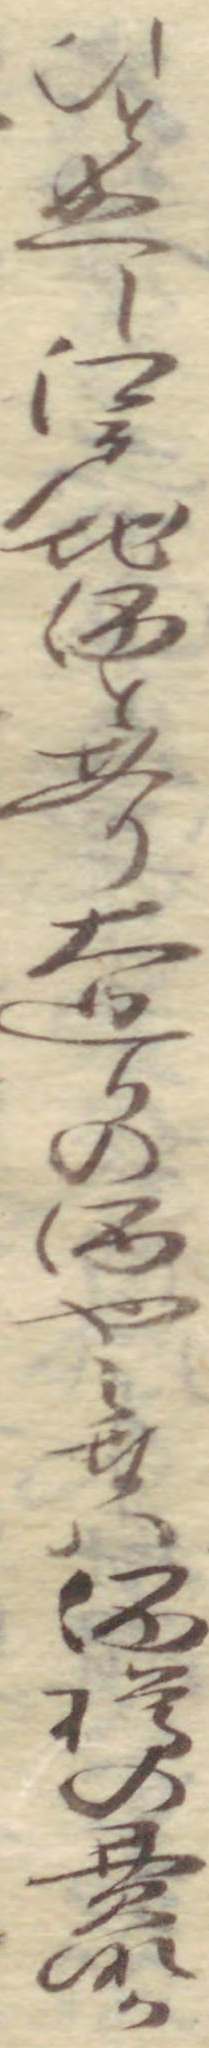ひと成へし江戸地酒となり大廻りの酒やみなは酒樽の費なか
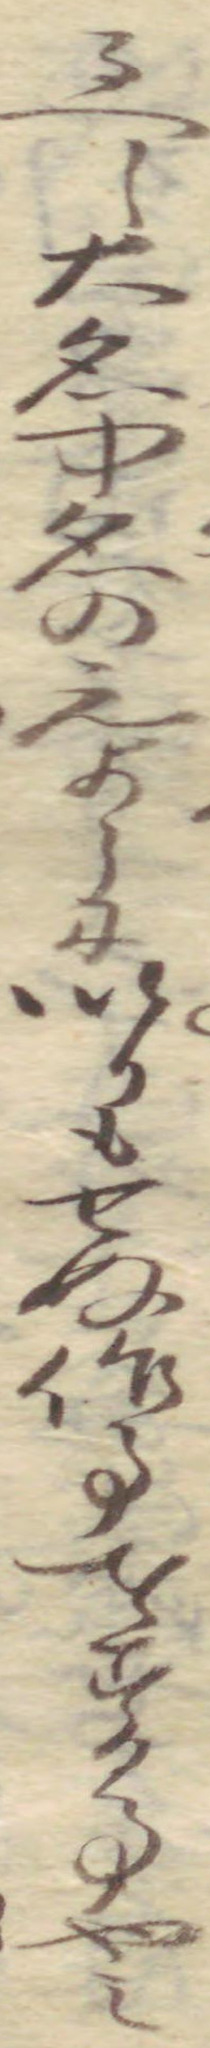るへし大名中名のえようにいりもせぬ作事をする事やみ
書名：鶯宿雑記. 巻263-264
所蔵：国立国会図書館 National Diet Library, JAPAN
